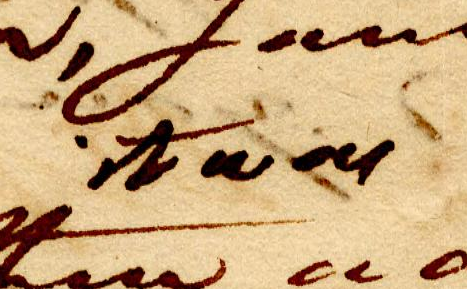it was
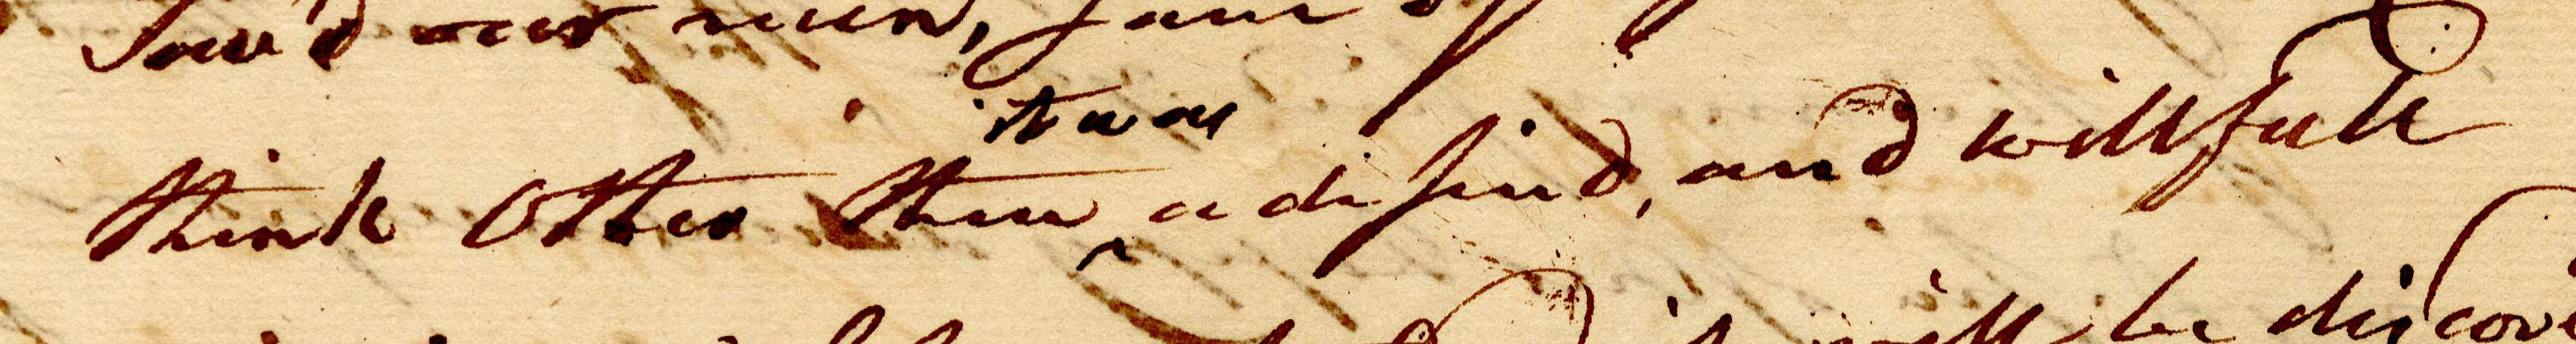think other the ^ a defind and willfull
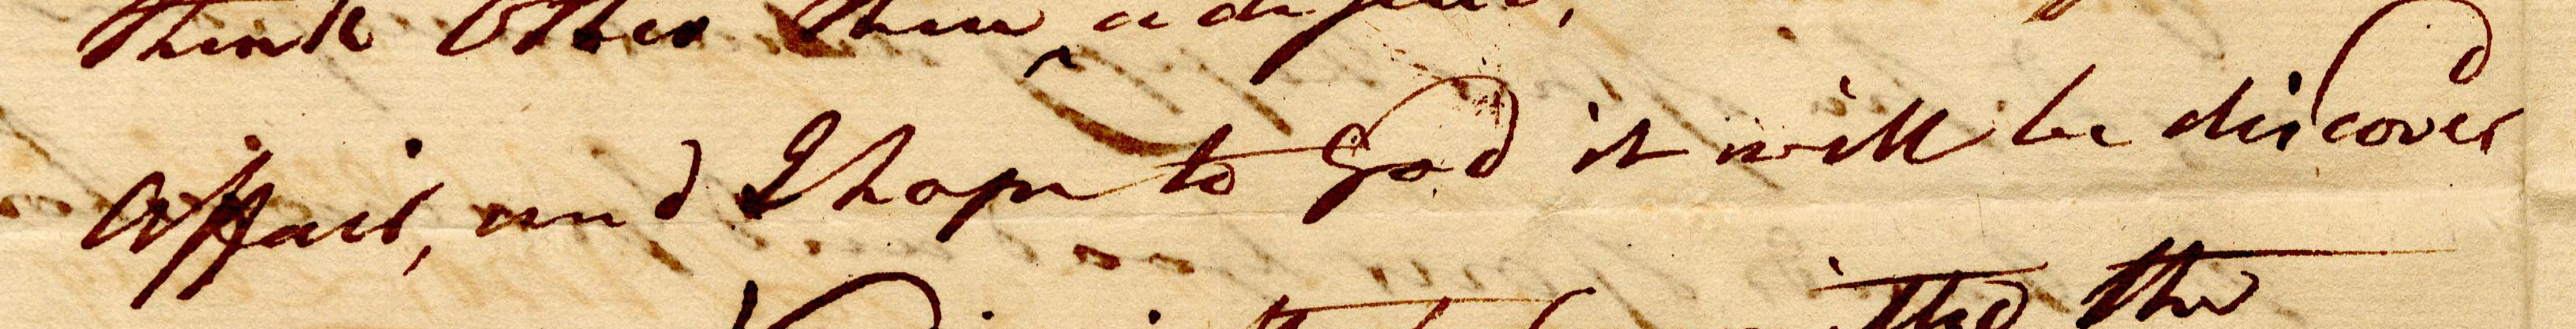affair, and I hope to God it will be discover^d
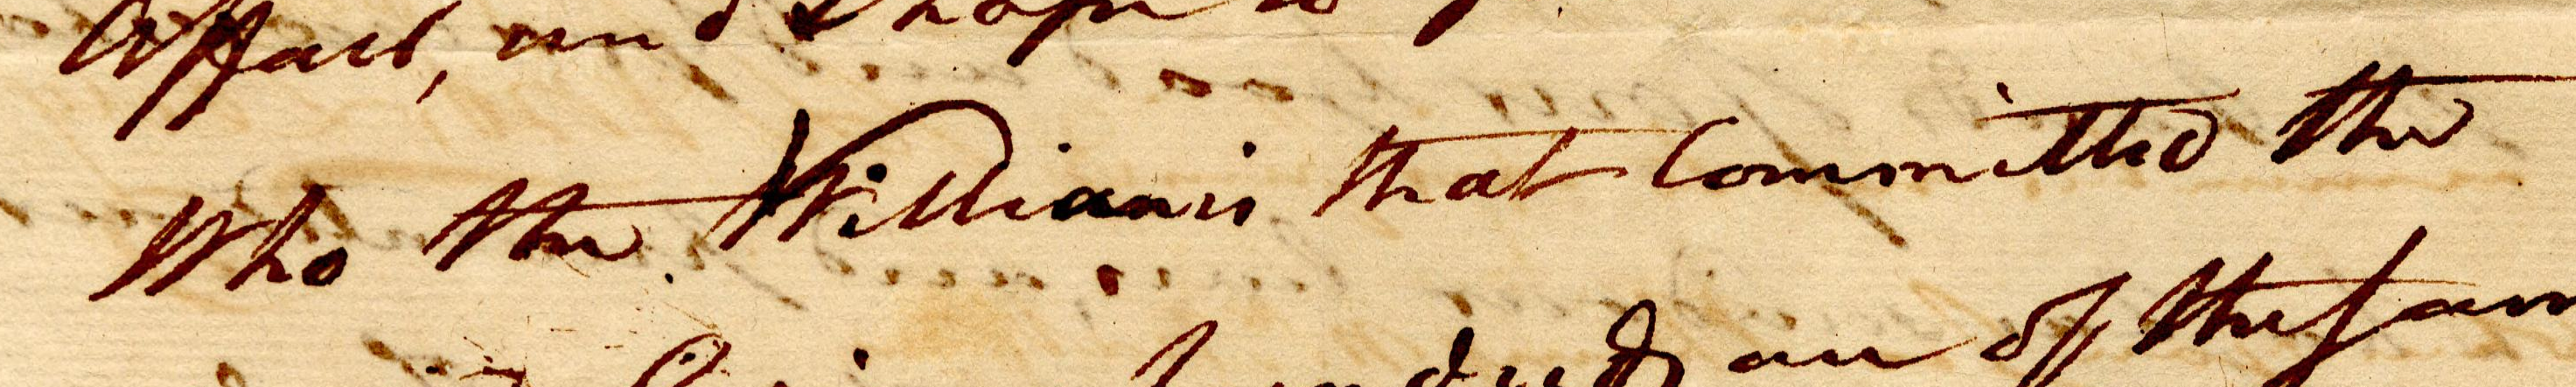Who the Villian is that Committd the
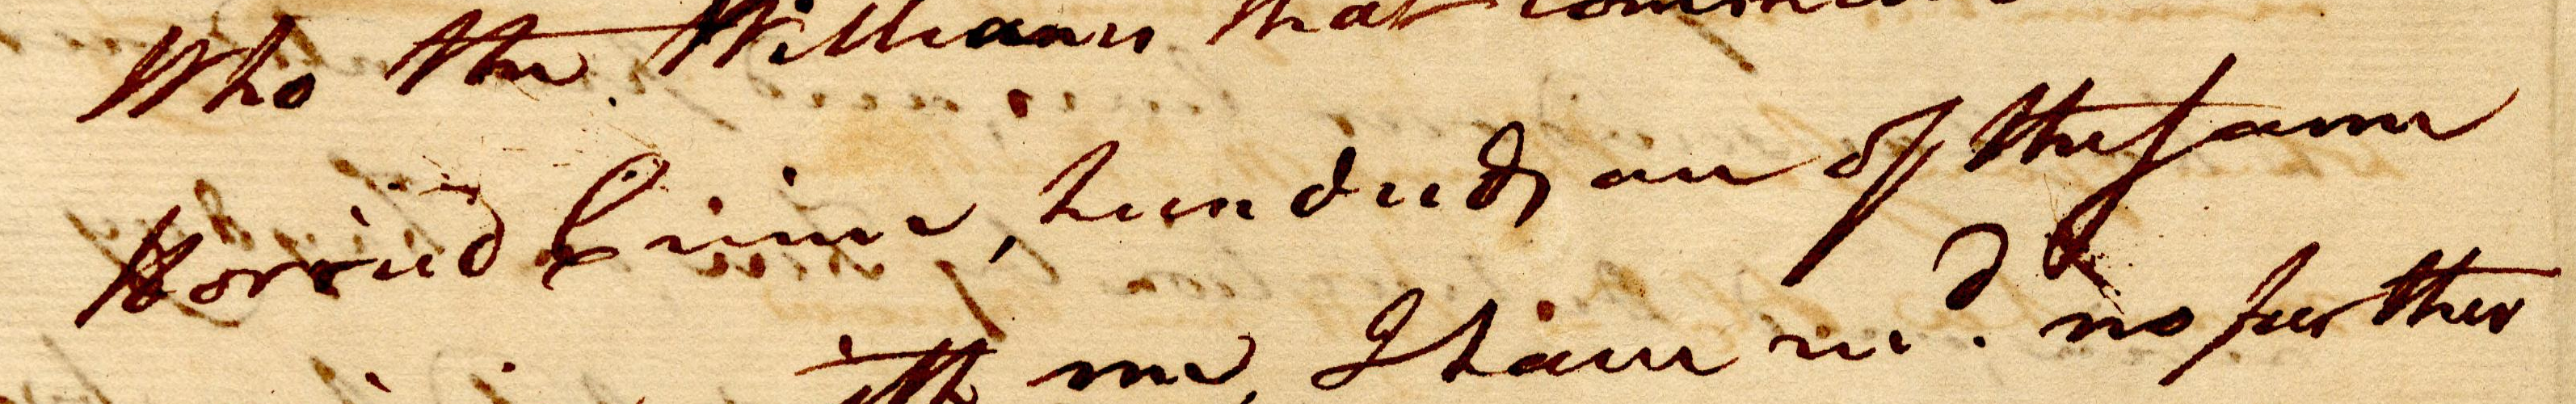Horrid crime, hundreds are of the same
